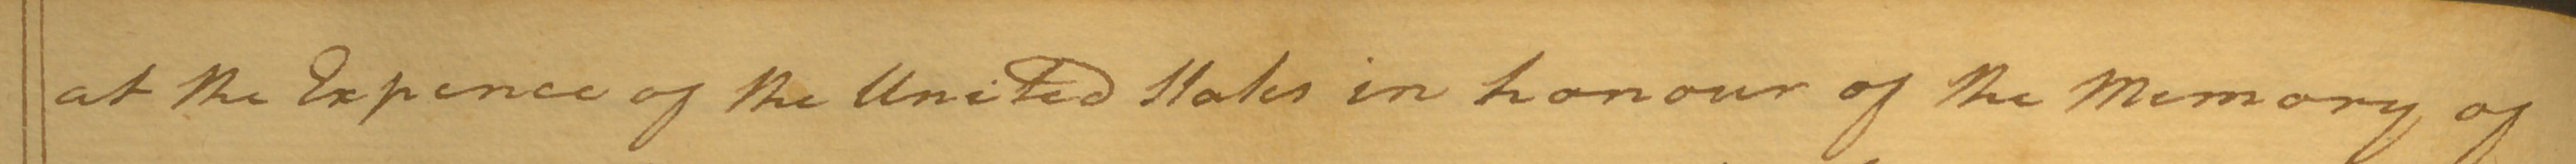at the Expence of the United States in honour of the Memory of
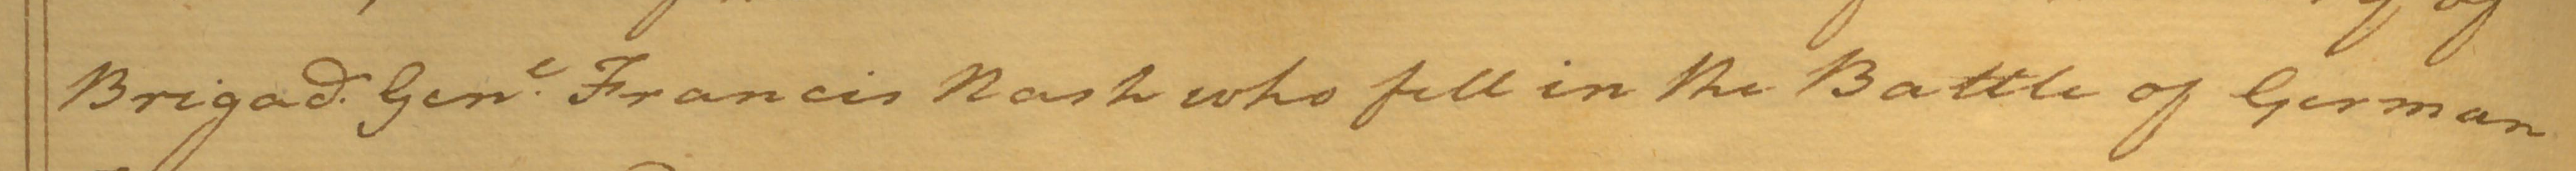Brigad. Gen^l. Francis Nash who fell in the Battle of German
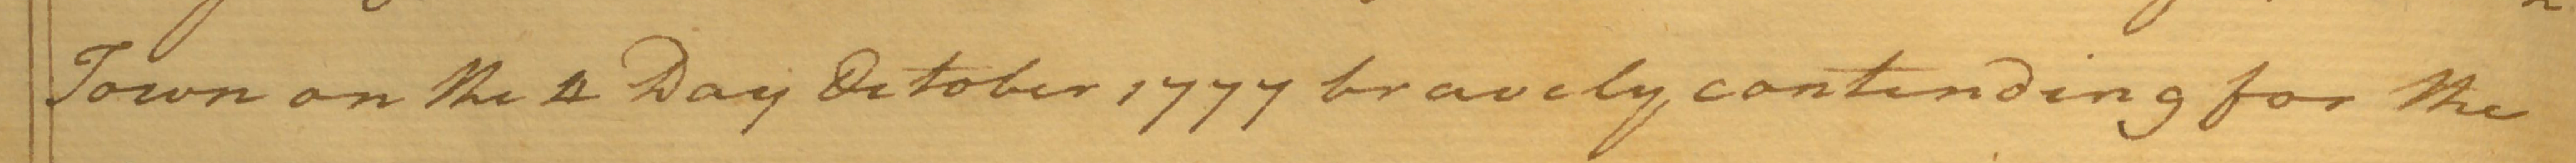Town on the 4 Day October 1777 bravely contending for the
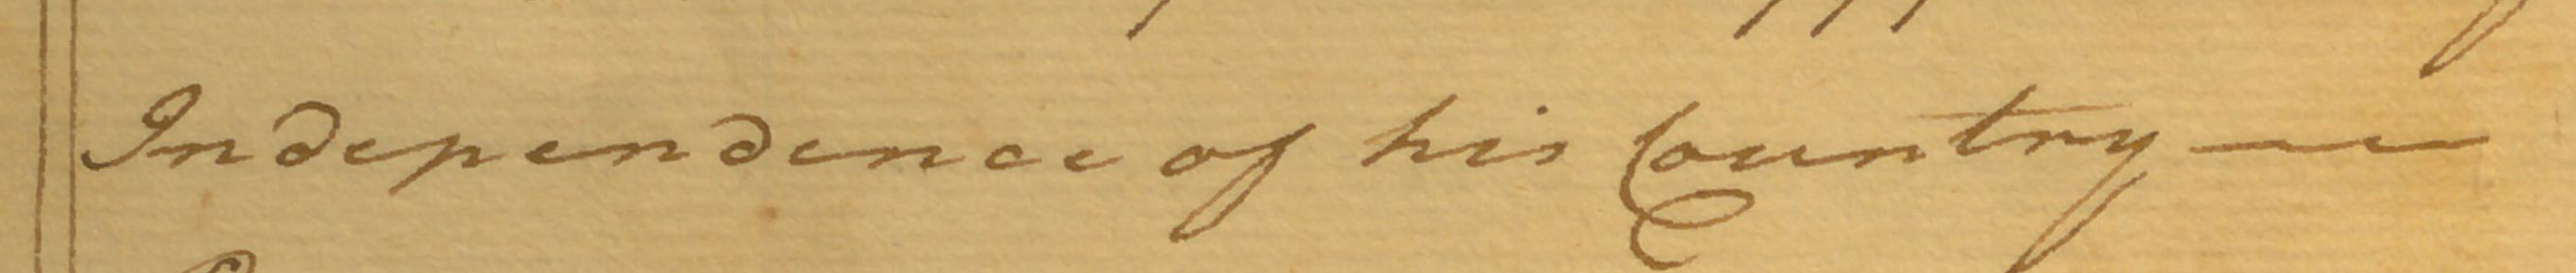Independence of his Country-
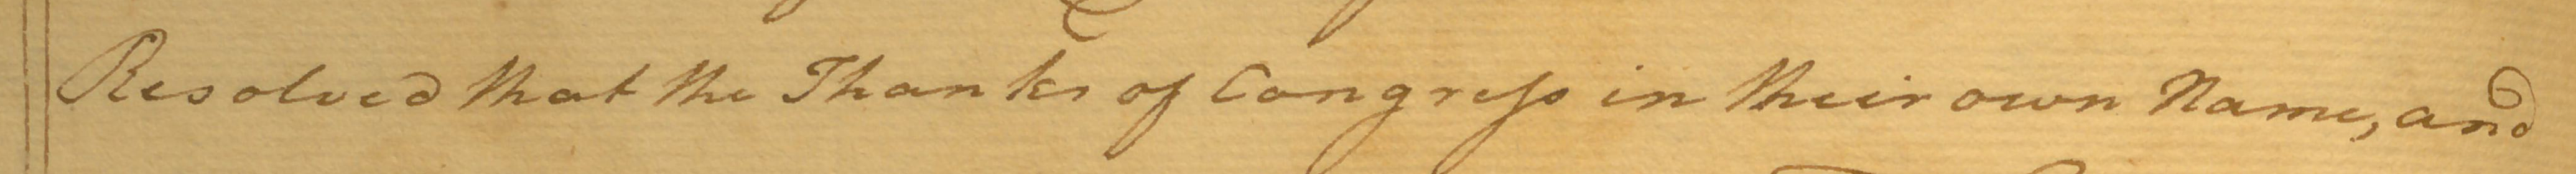Resolved that the Thanks of Congress in their own Name, and
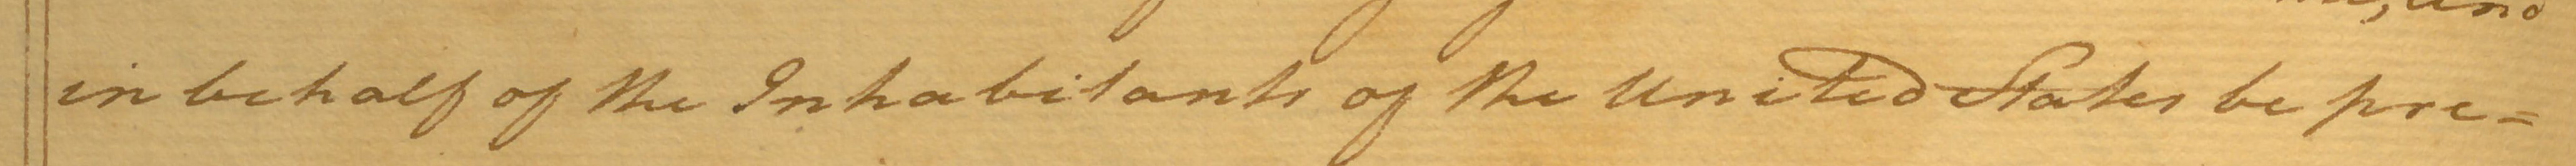in behalf of the Inhabitants of the United States be pre-
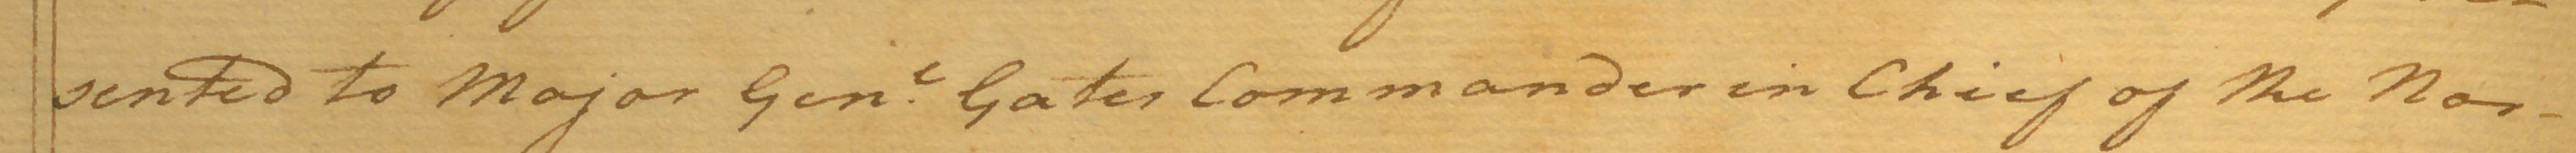sented to Major Gen^l. Gates Commander in Chief of the Nor-
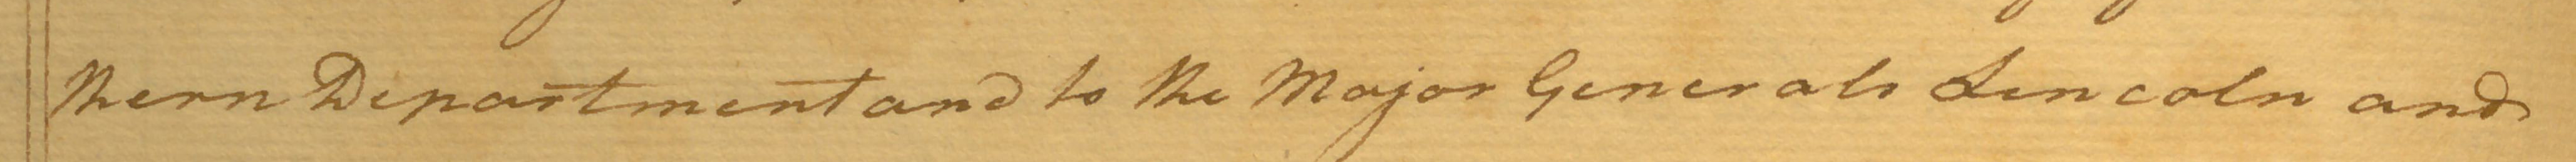thern Department and to the Major Generals Lincoln and
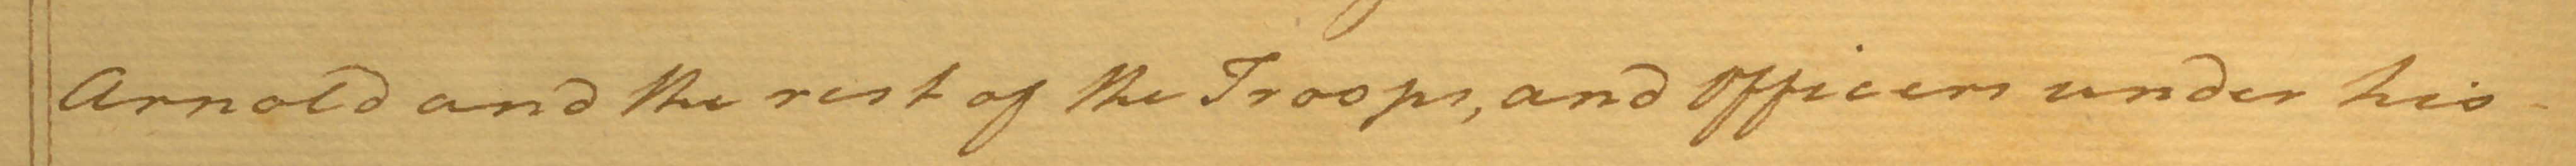Arnold and the rest of the Troops, and Officers under his
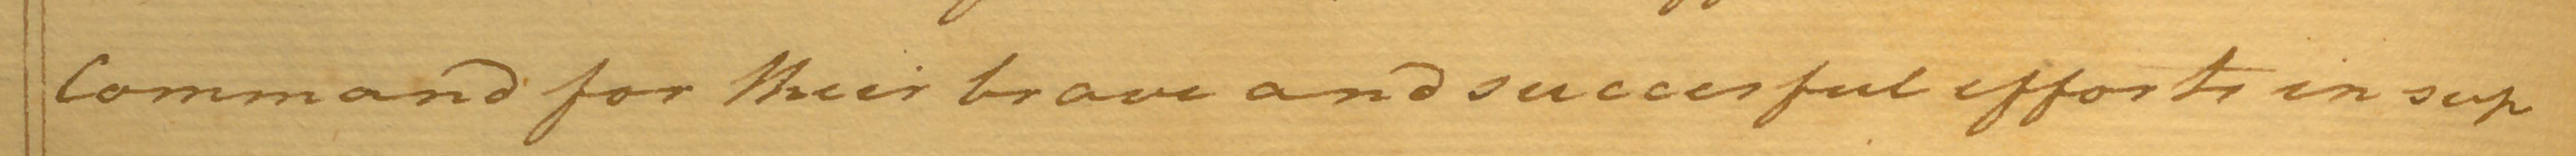Command for their brave and successful efforts in sup
